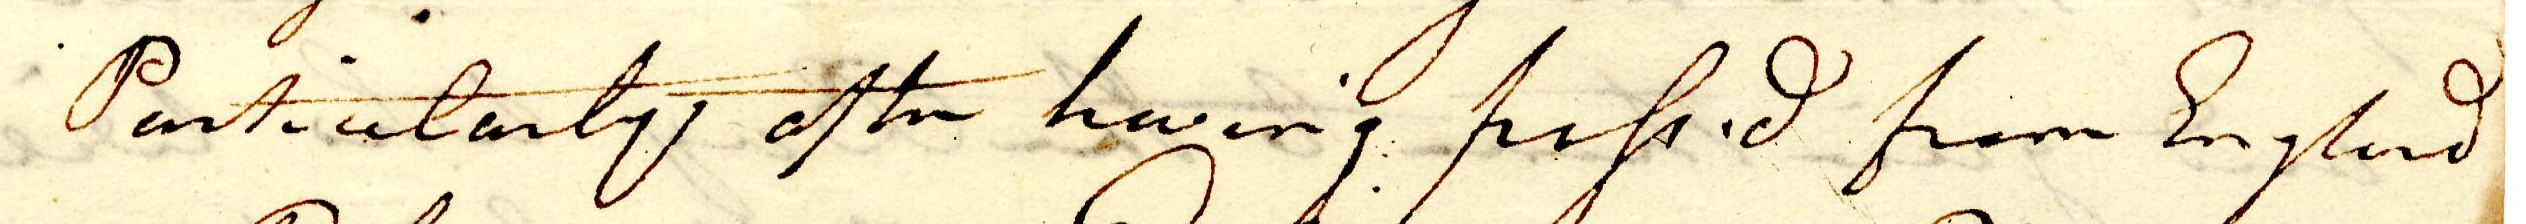Particularly after having pass'd from England
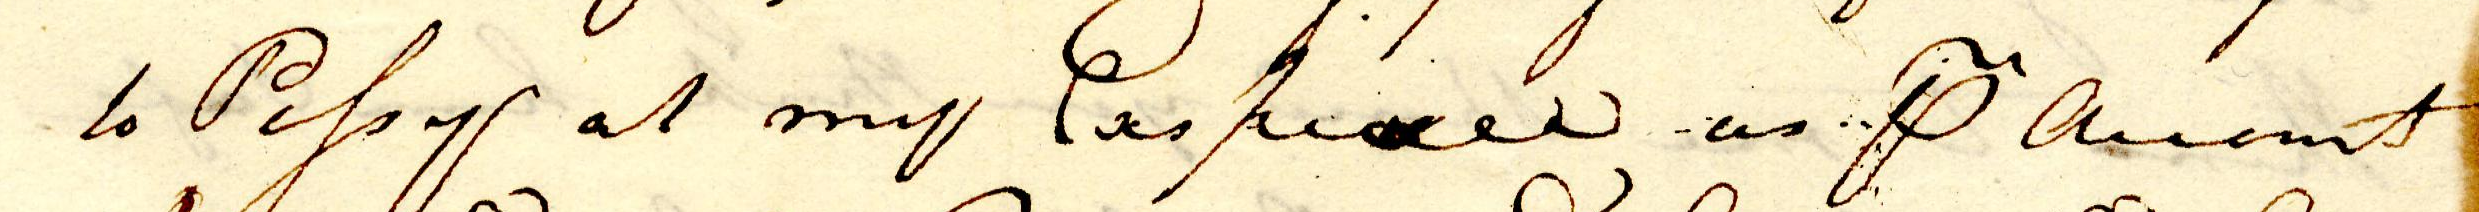to Passy at my Expence as per Account
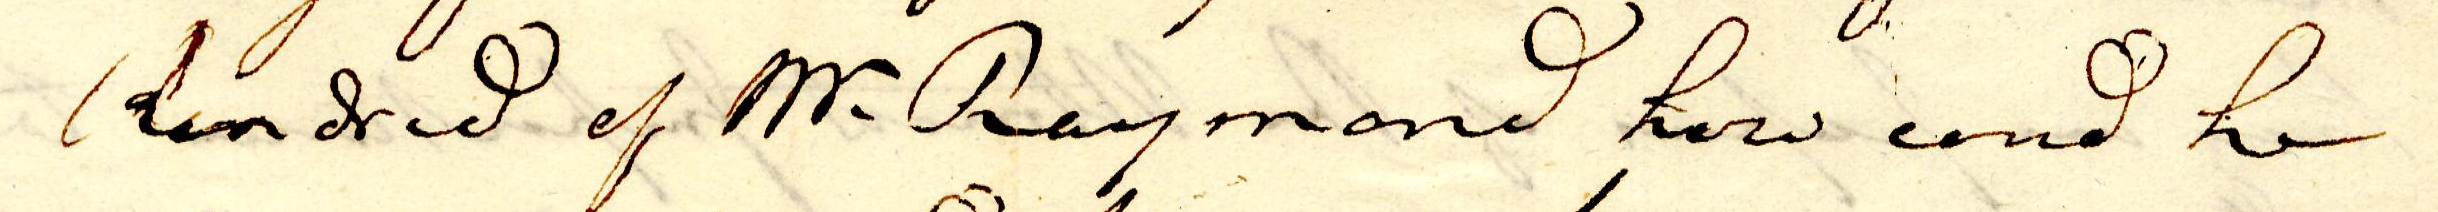rendred of M^r. Raymond how coud he
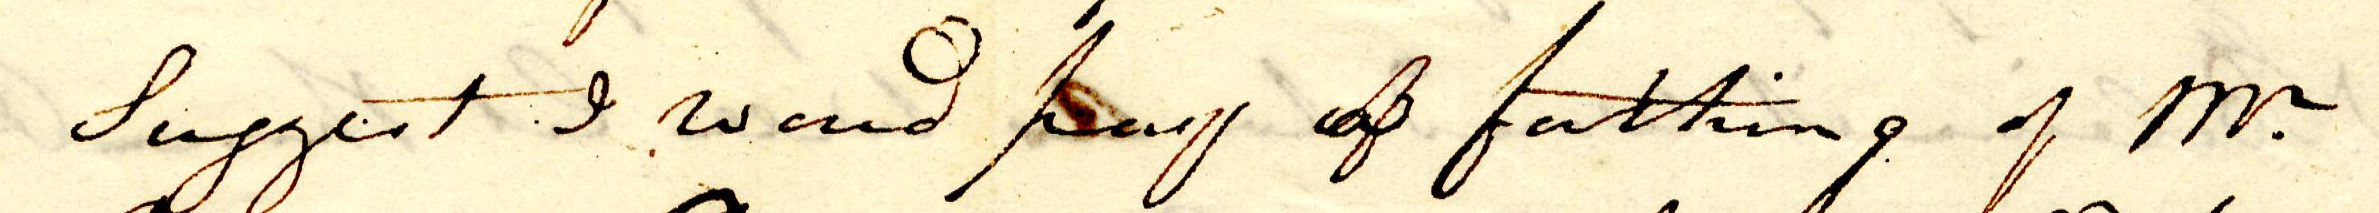Suggest I woud pay a farthing of M^r.
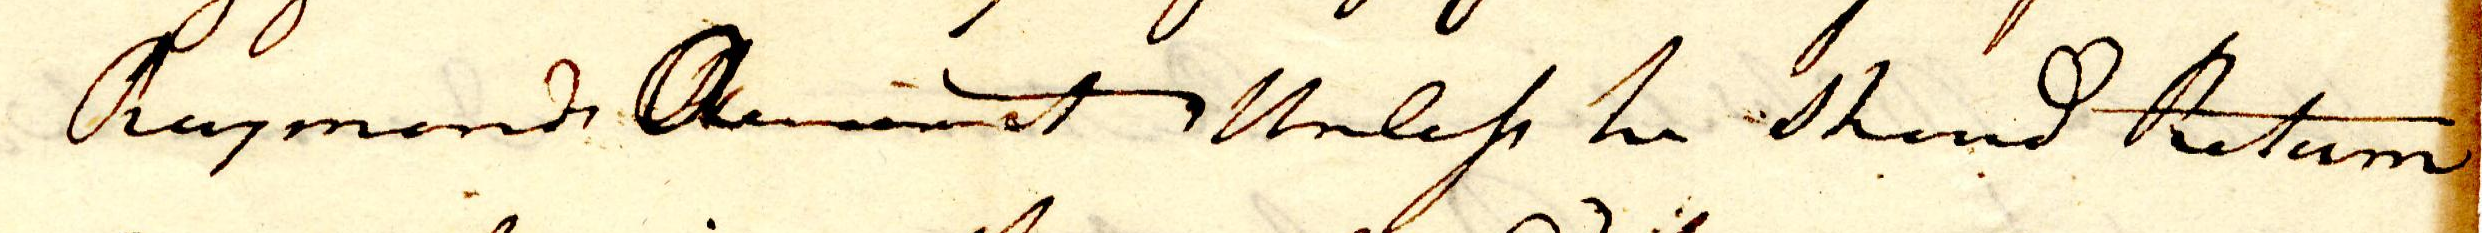Raymonds Account Unless he should Return
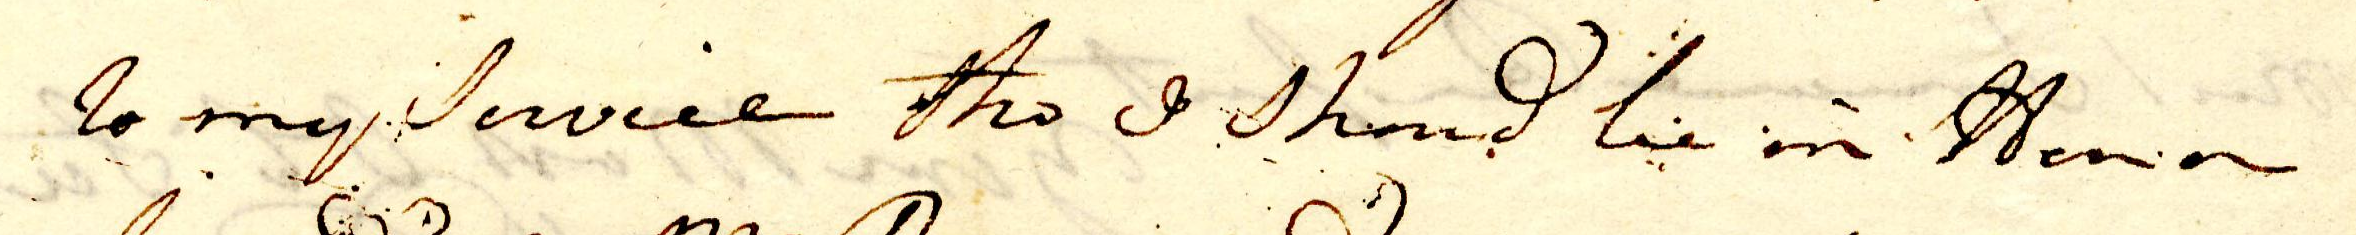to my Service tho I shoud be in Honor
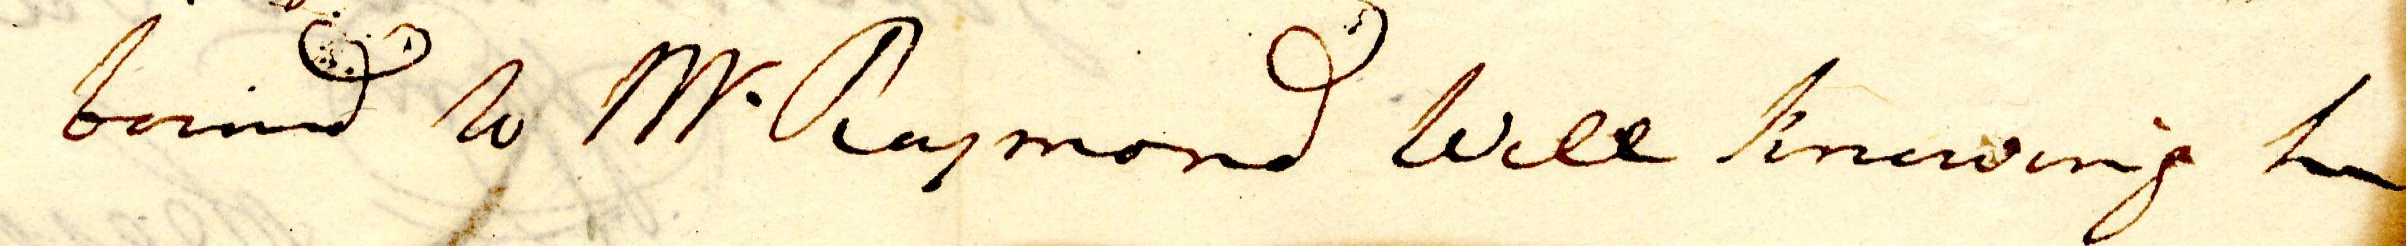bound to M^r. Raymond well knowing he
